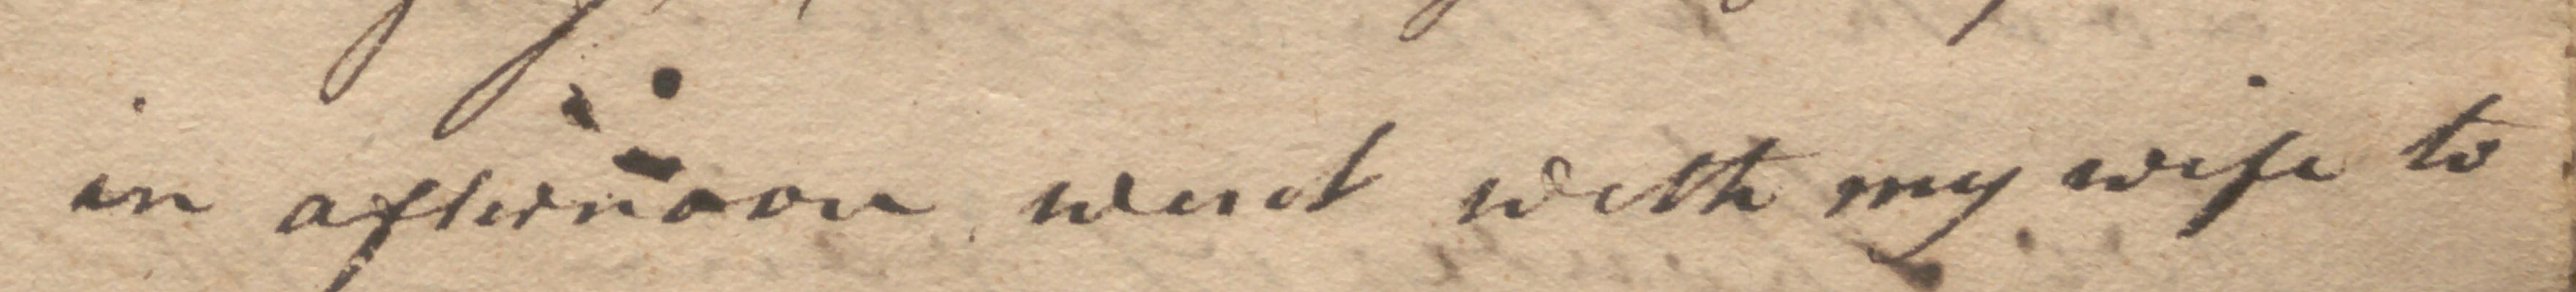in afternoon went with my wife to
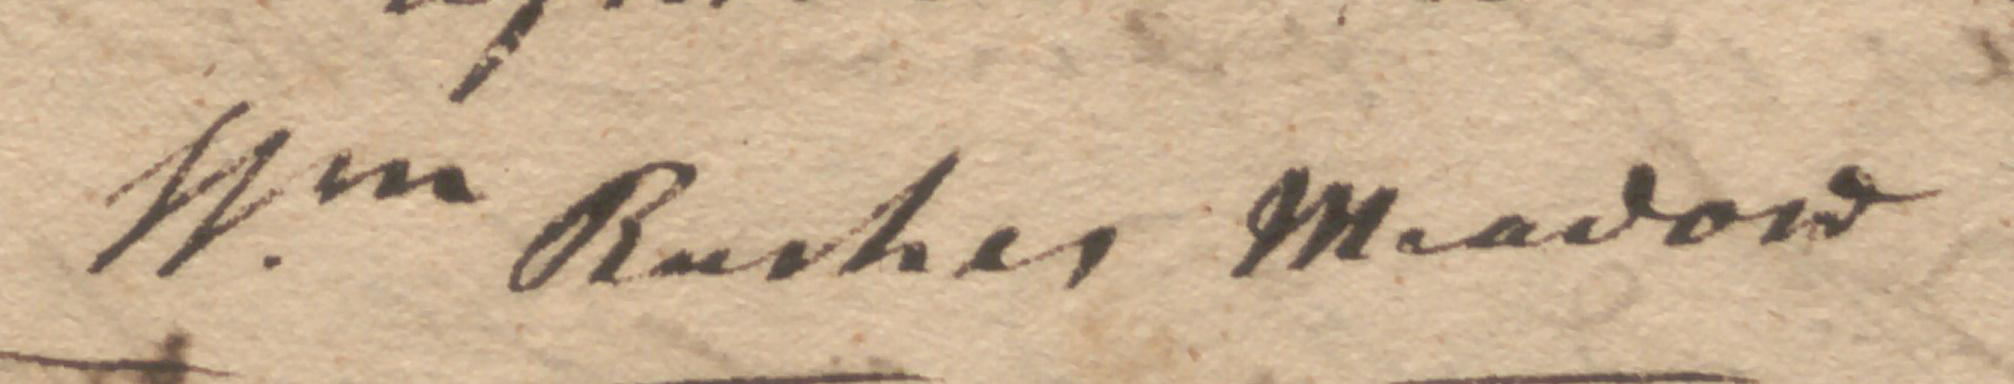W^m. Rushes Meadow
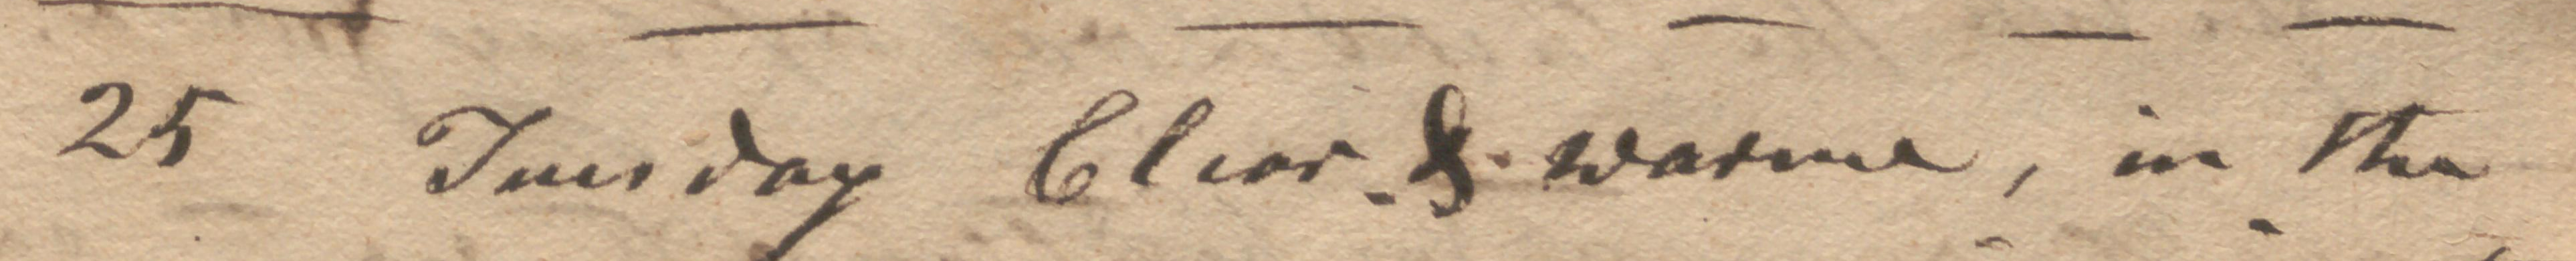25 Tuesday Clear & warme, in the
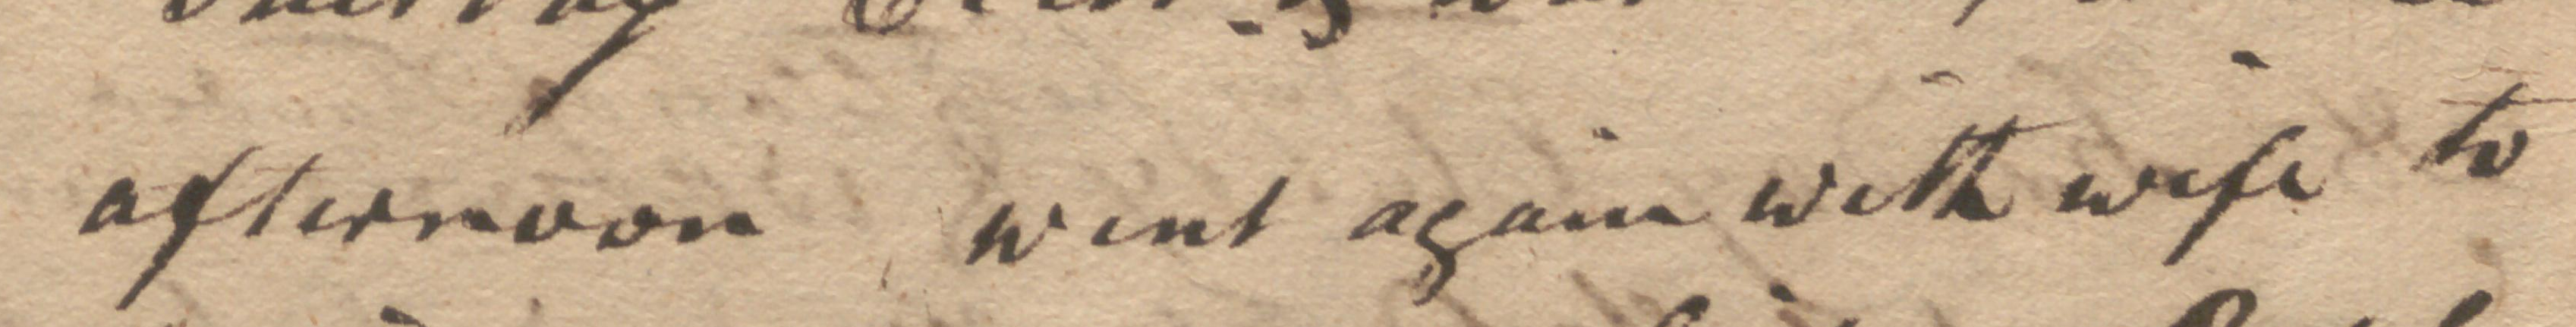afternoon went again with wife to
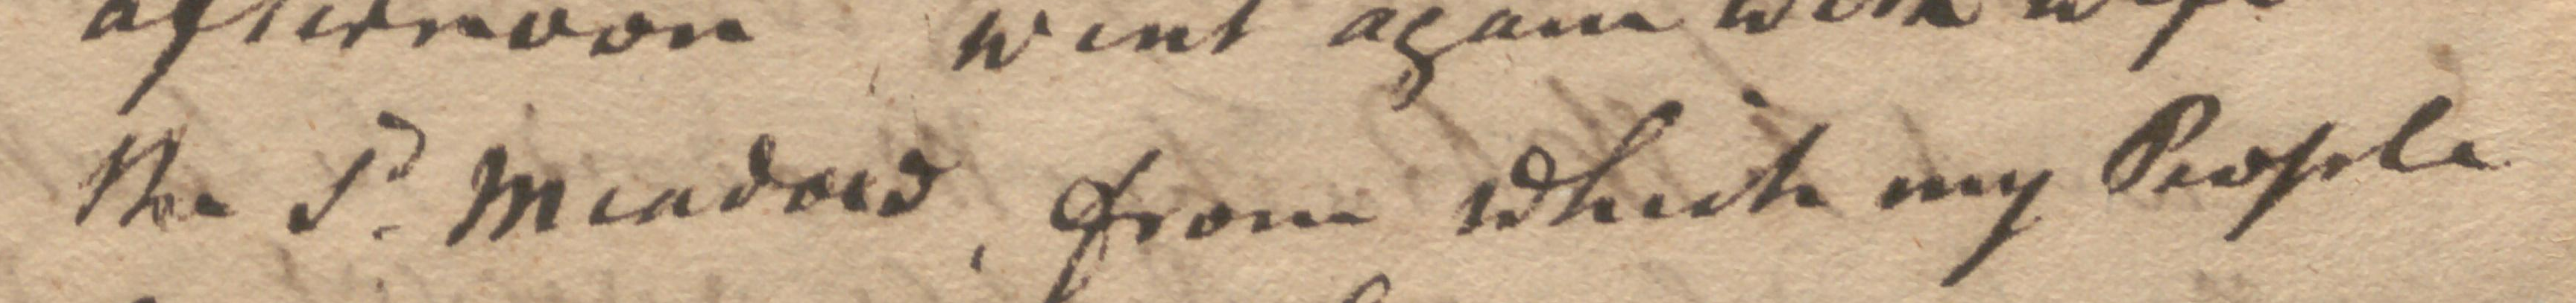the s^d. Meadew from which my People
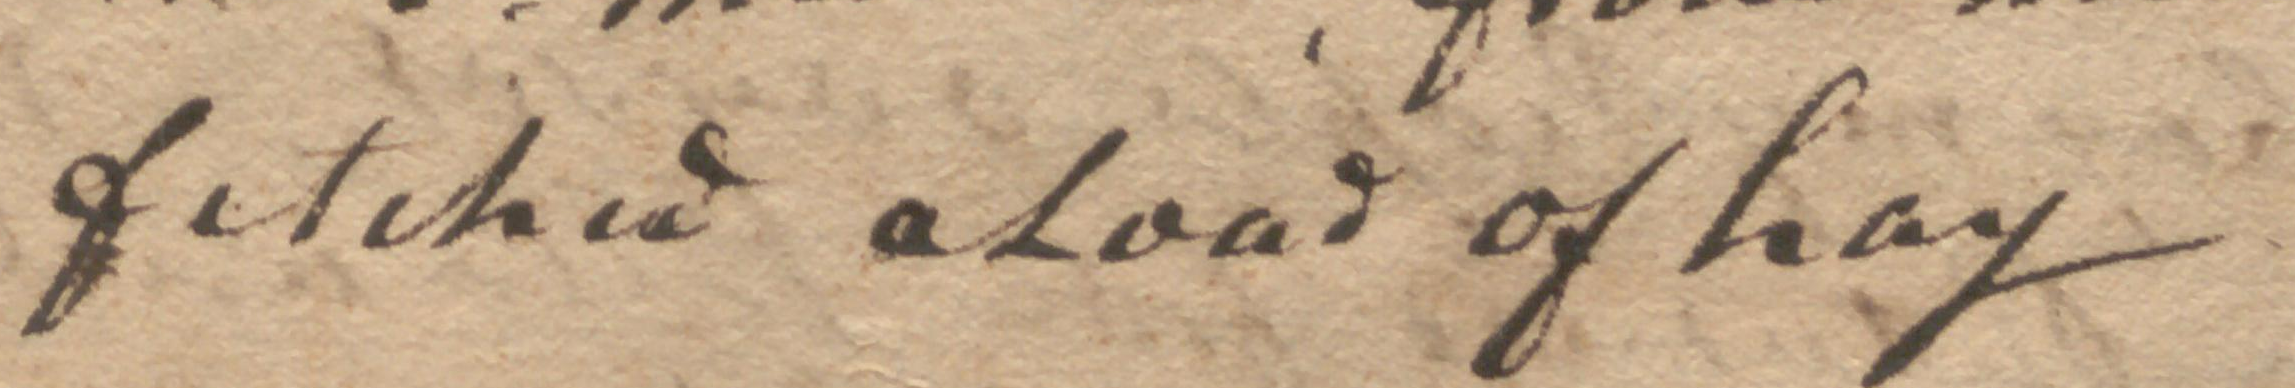fetched a Load of hay
